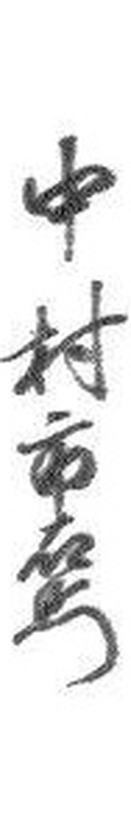中村市右衛門
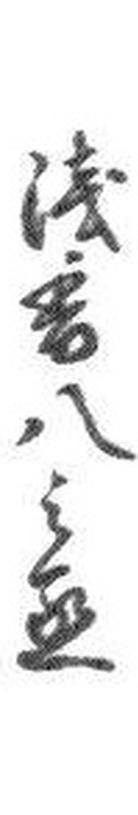浅香八之丞

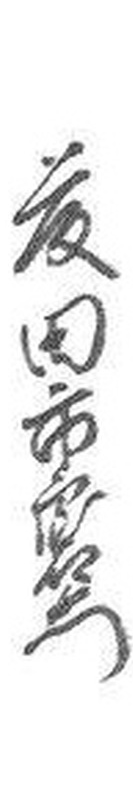藤田市郎右衛門
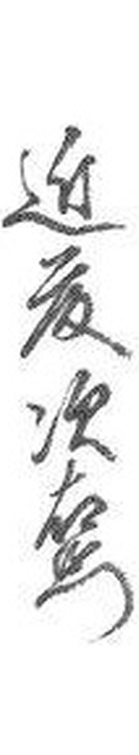近藤次右衛門
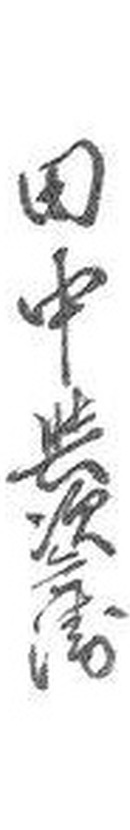田中与次兵衛
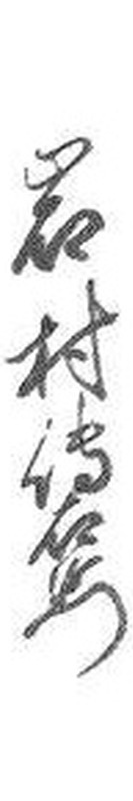岩村伝右衛門
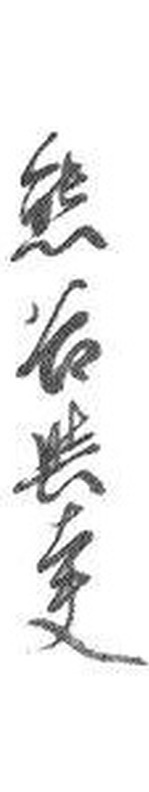熊谷与太夫
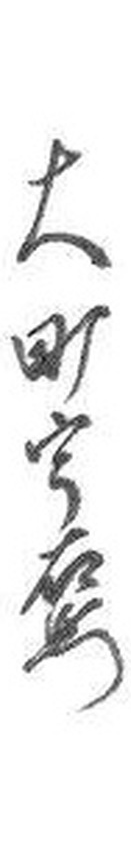大町宇右衛門
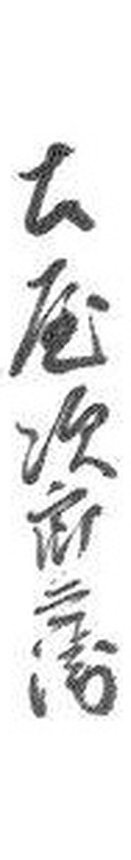土屋次郎兵衛
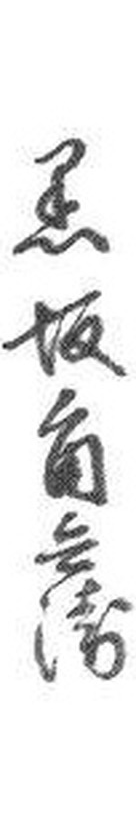黒坂角兵衛
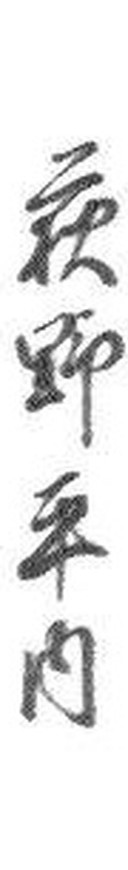荻野平内
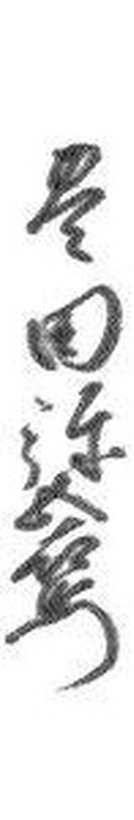豊田弥五右衛門
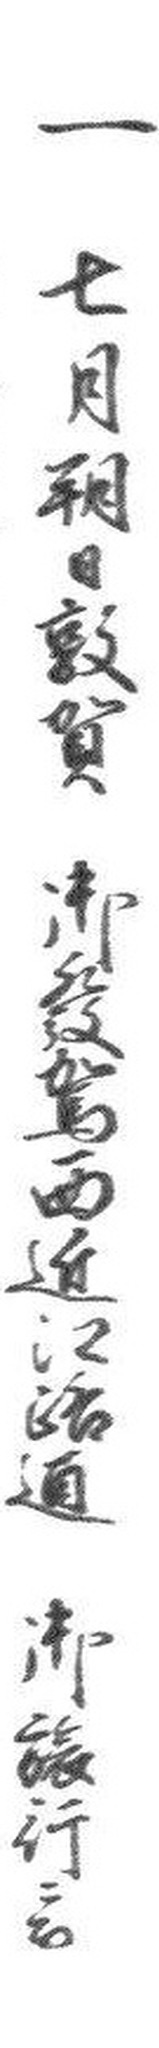一七月朔日敦賀御発駕西近江路通御旅行ニ而

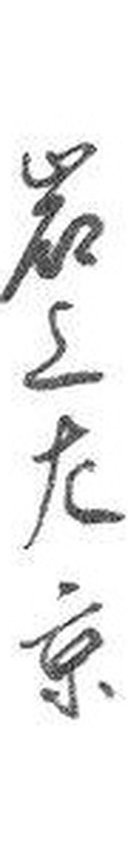岩上左京
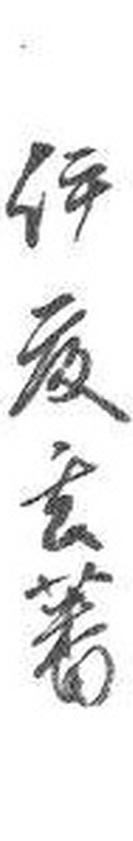伊藤玄蕃
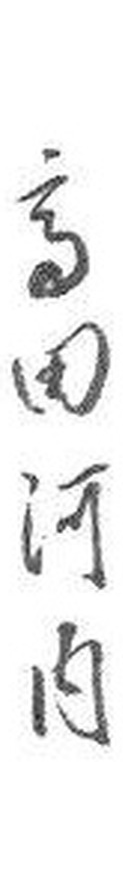高田河内
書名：家譜 四 忠昌公 従寛永七年到正保四年
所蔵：福井県文書館 Fukui Prefectural Archives
